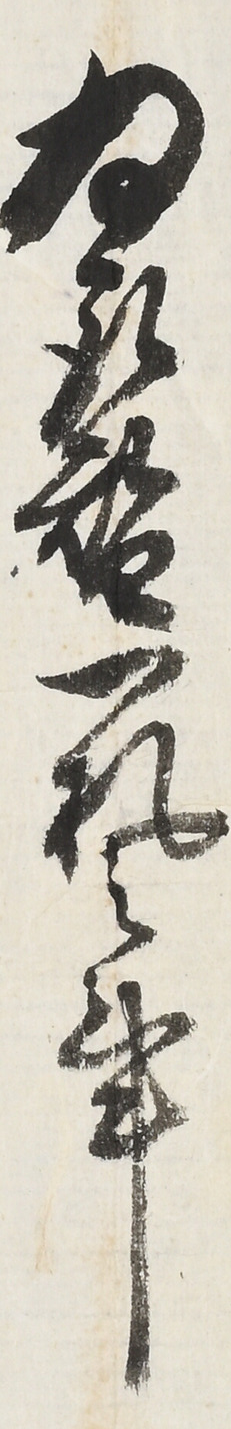為取替一札之事
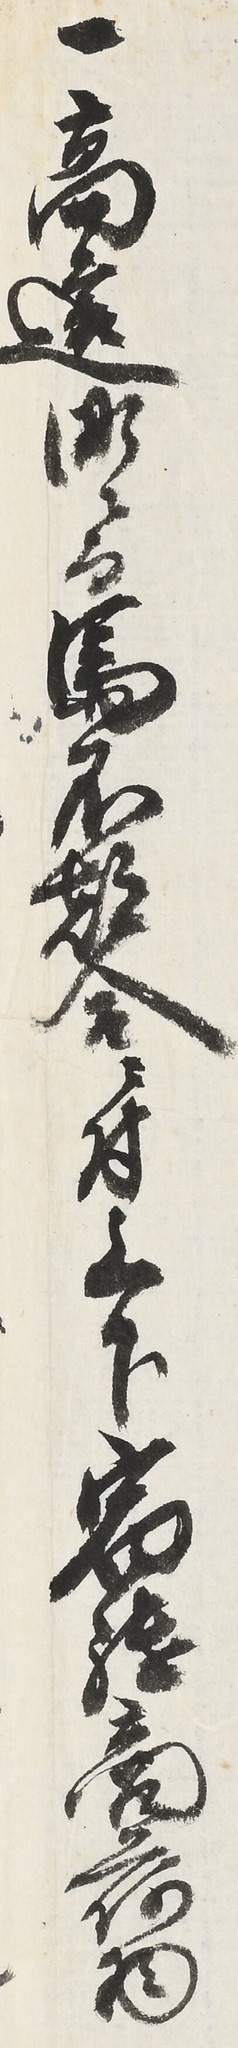一高遠町ニ而馬不都合ニ付上下宿継商荷物
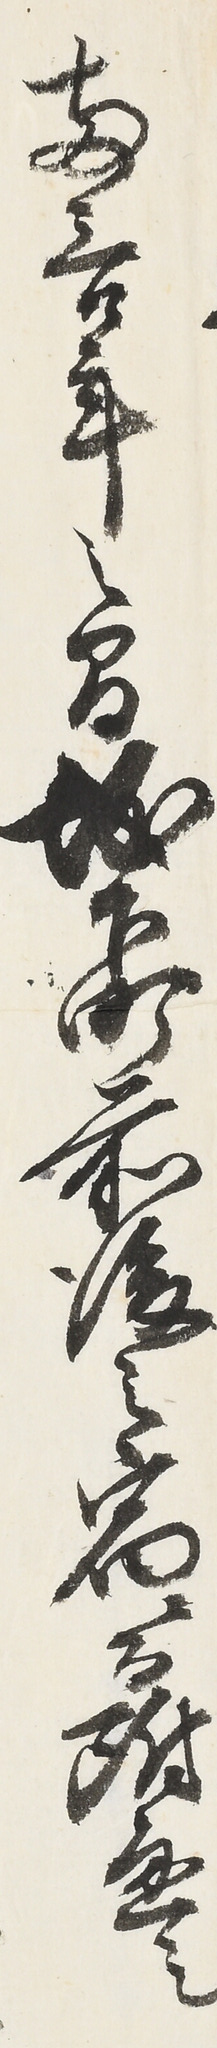両三ケ年之間城下町前後之宿ニ而附通シ
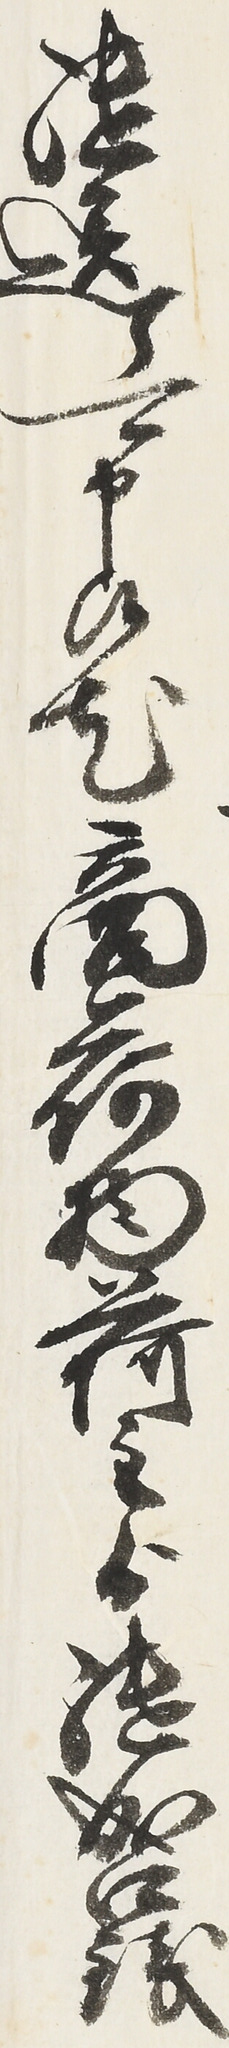継送り可申候尤商荷物荷主ゟ継成口銭
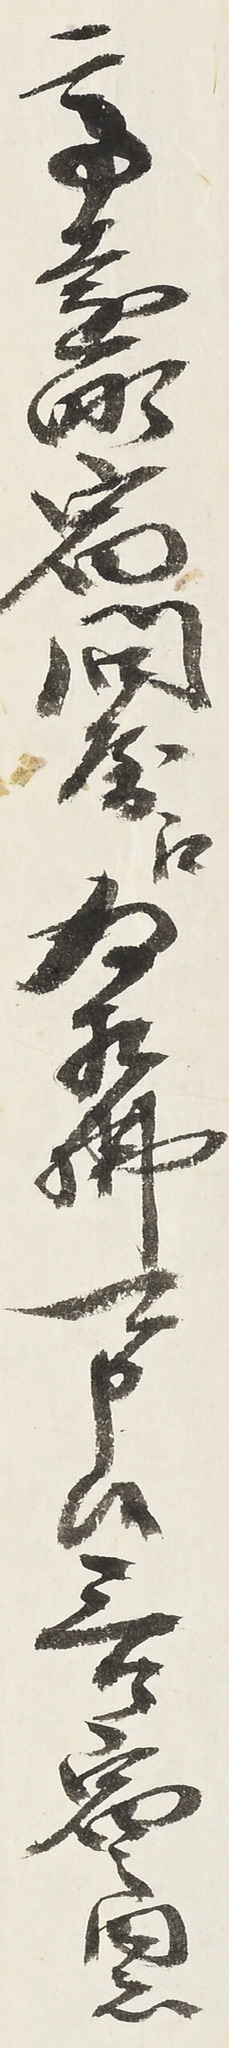高遠町宿問屋江為相払可申候三ケ宿之内者
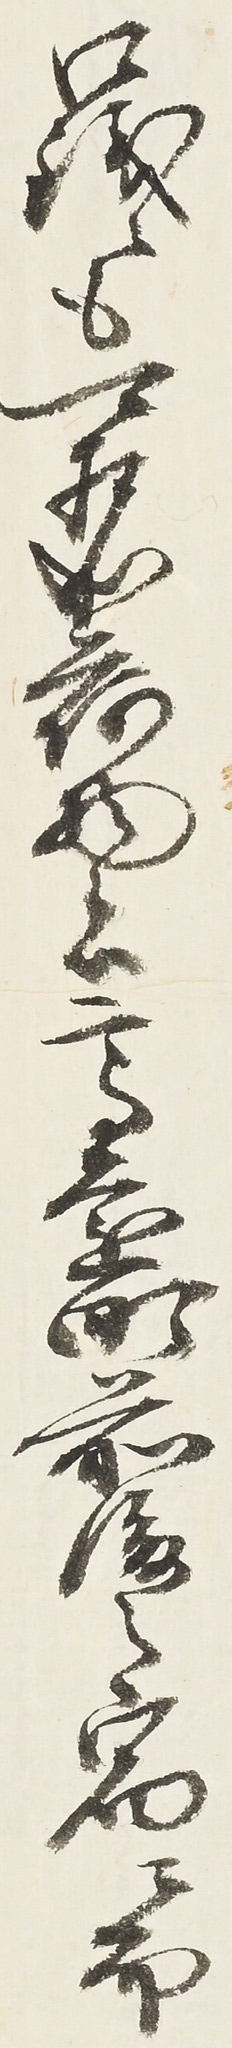口銭ニも可相成荷物者高遠町前後之宿ニ而
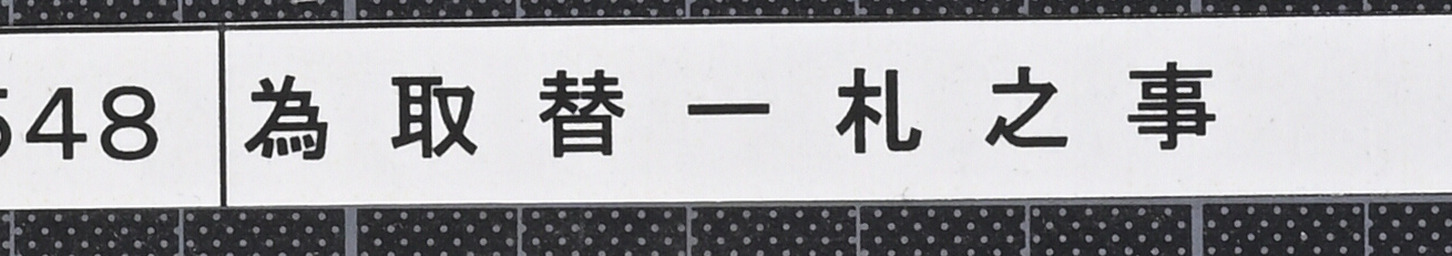為取替一札之事
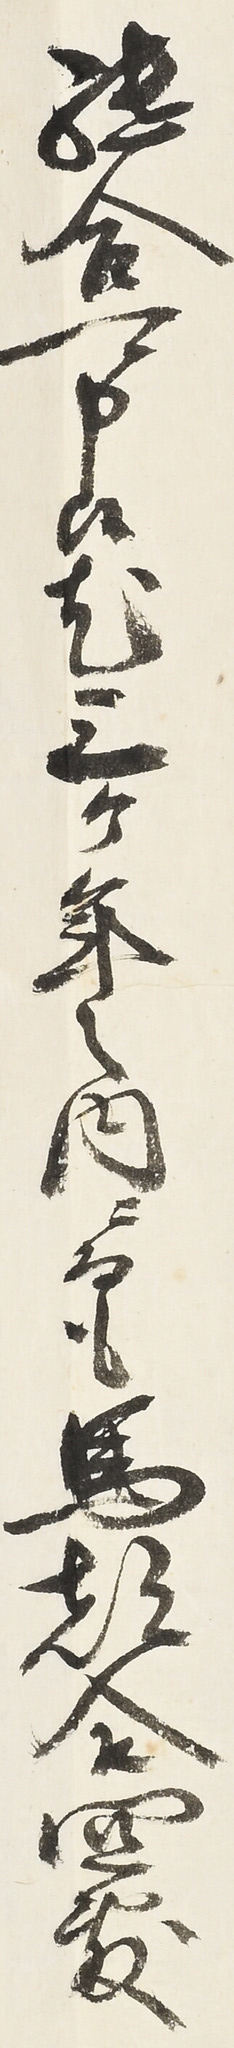継合可申候尤三ケ年之内ニ而も馬都合宜敷
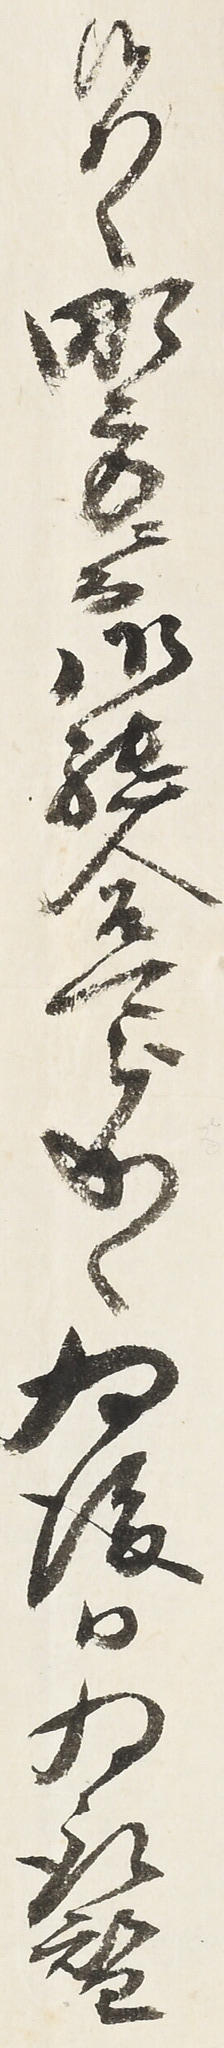候ハゝ町方ニ而御継合可被成候為後日為取替
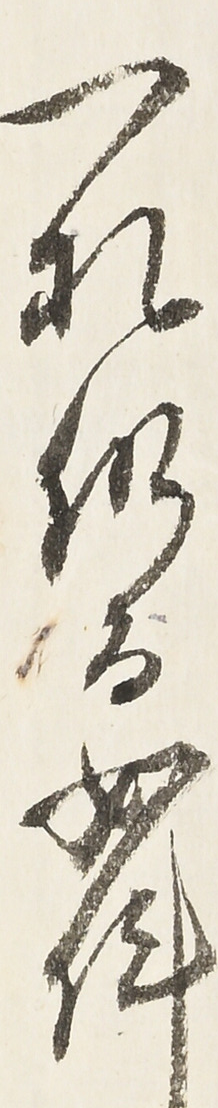一札仍而如件
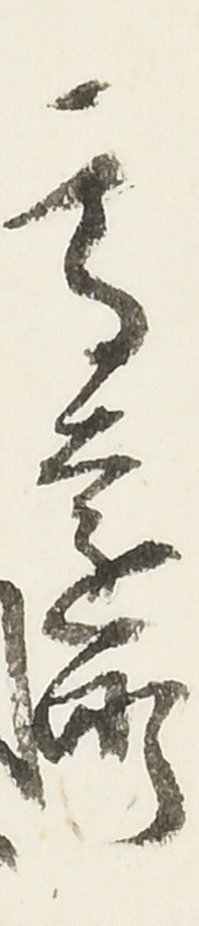高遠町
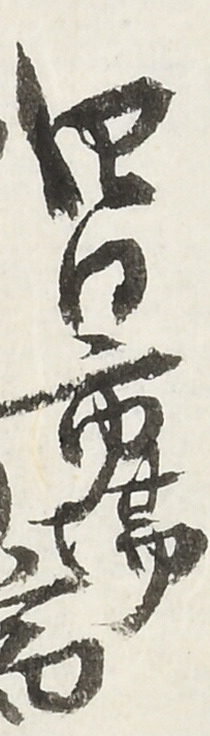四日市場
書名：為取替一札之事
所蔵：伊那市立高遠町図書館・合同会社AMANE
